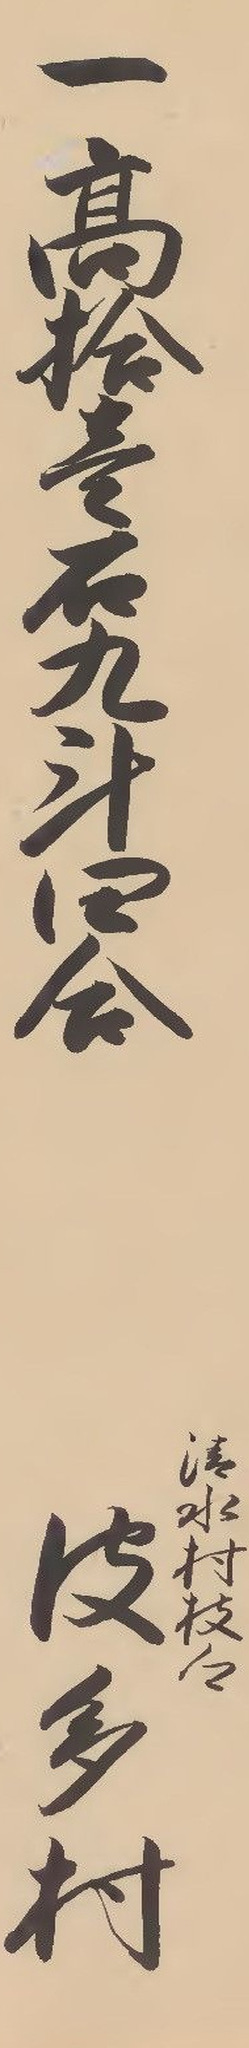一高拾壱石九斗四合皮多村
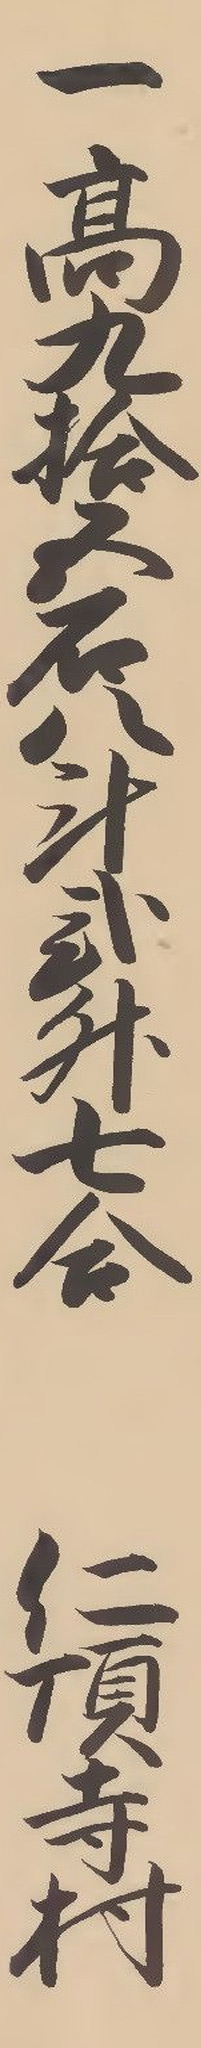一高九拾五石八斗弐升七合仁頂寺村
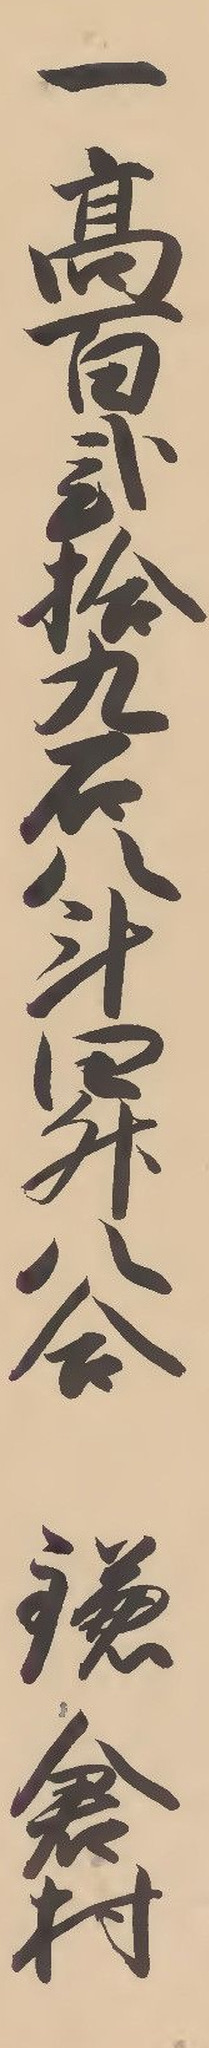一高百弐拾九石八斗四升八合鎌倉村

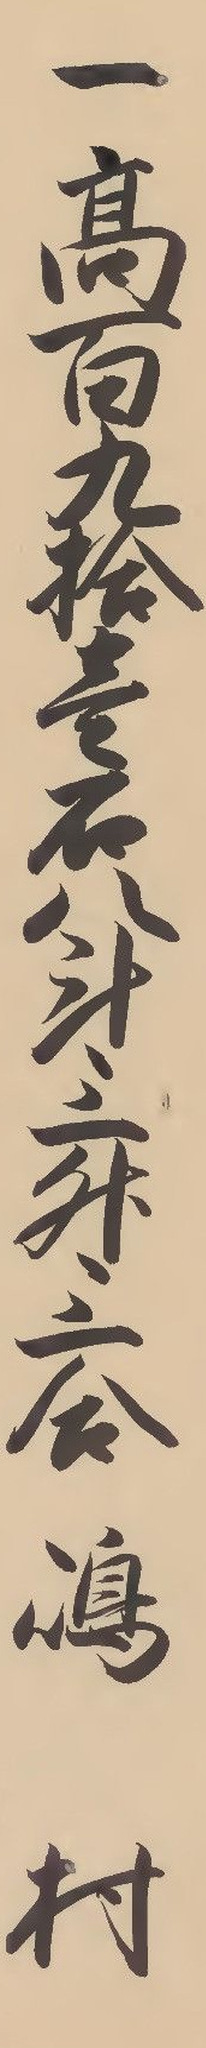一高百九拾壱石八斗三升三合島村
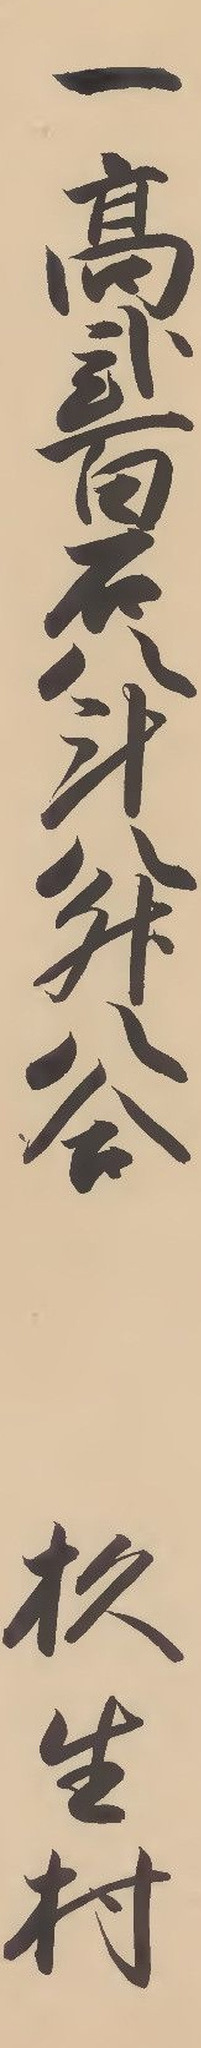一高弐百石八斗八升八合杉生村
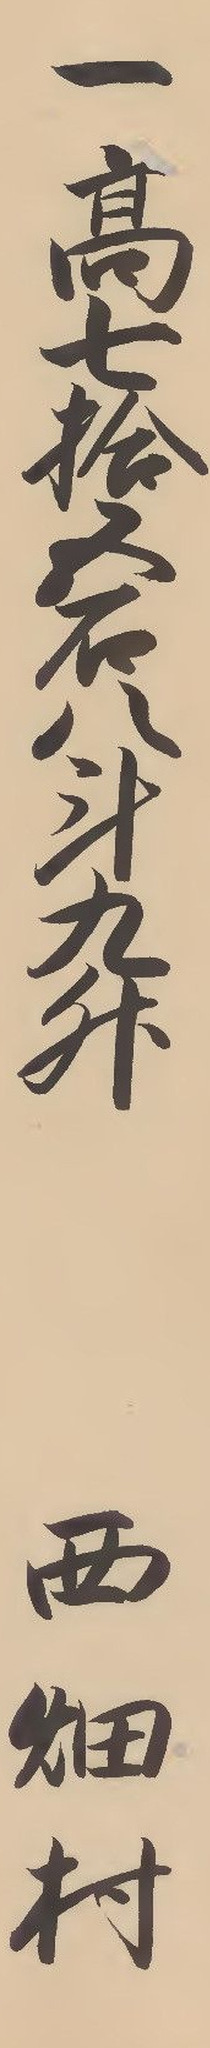一高七拾五石八斗九升西畑村
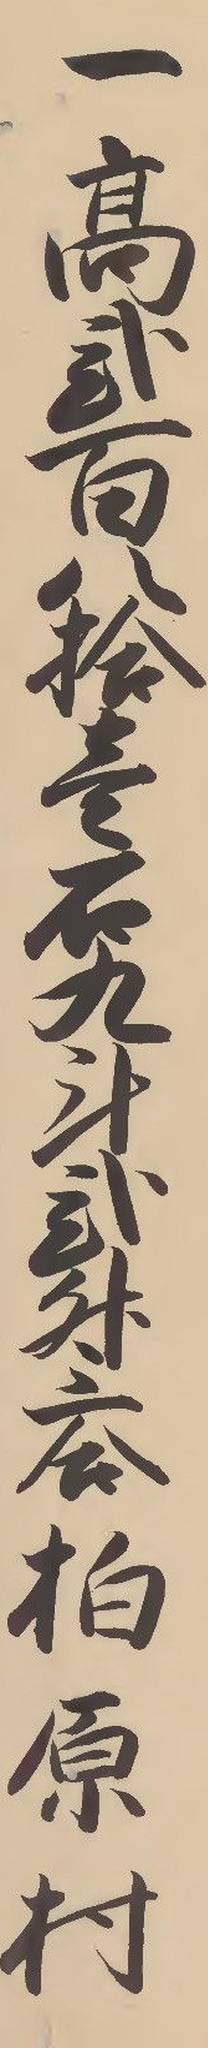一高弍百八拾壱石九斗弐升三合柏原村
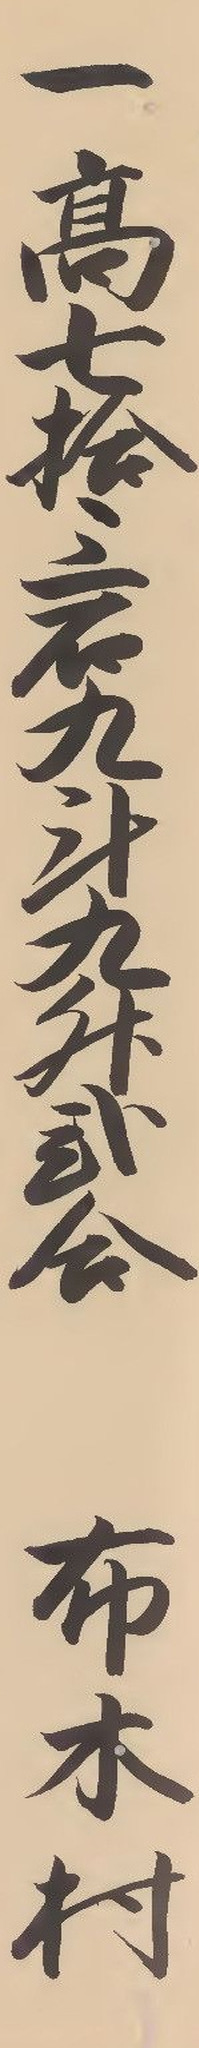一高七拾三石九斗九升弐合布木村
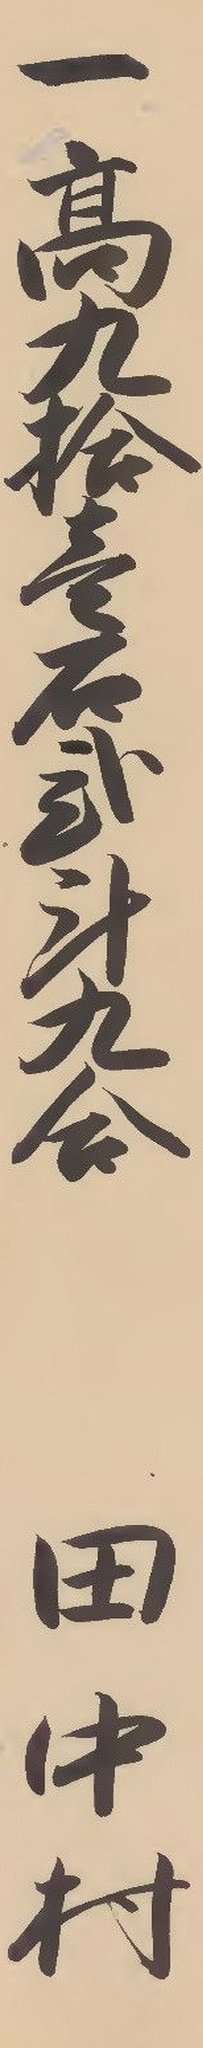一高九拾壱石弐斗九合田中村
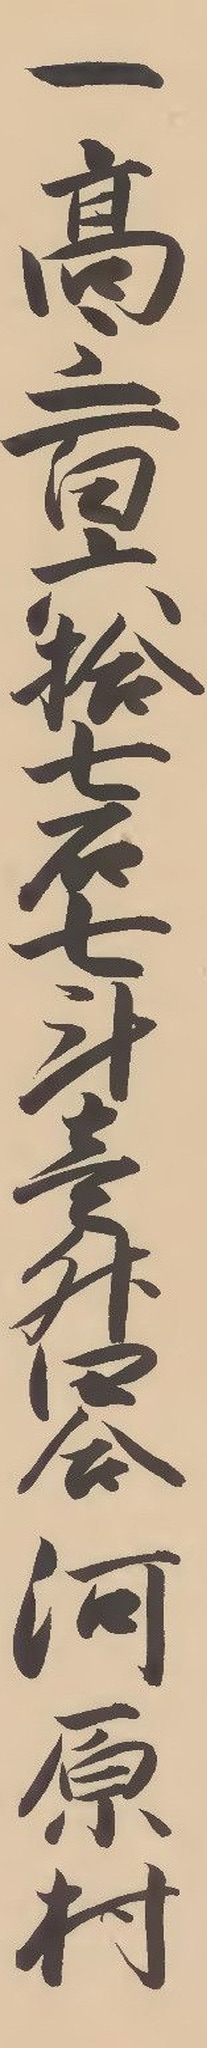一高三百六拾七石七斗壱升四合河原村
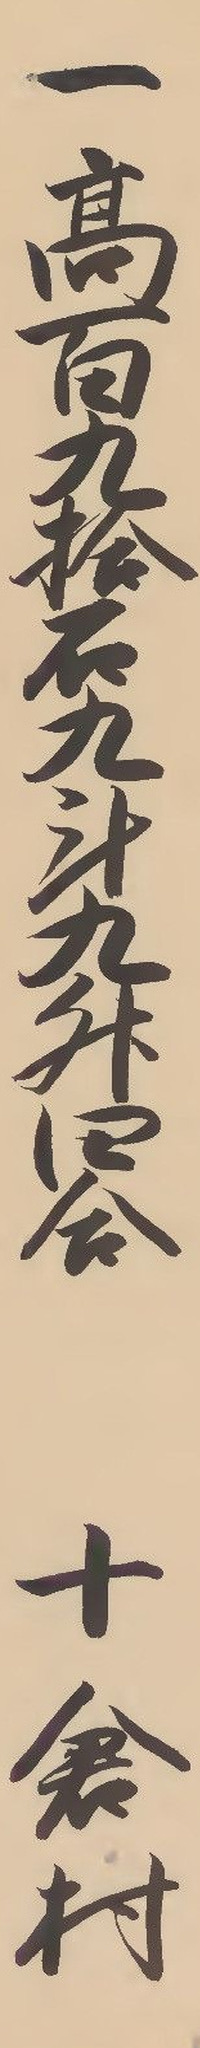一高百九拾石九斗九升四合十倉村

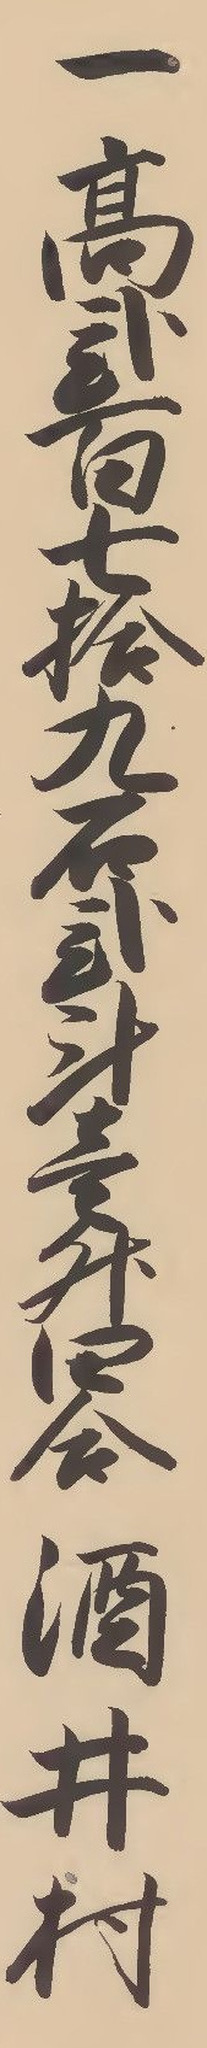一高弐百七拾九石弐斗壱升四合酒井村
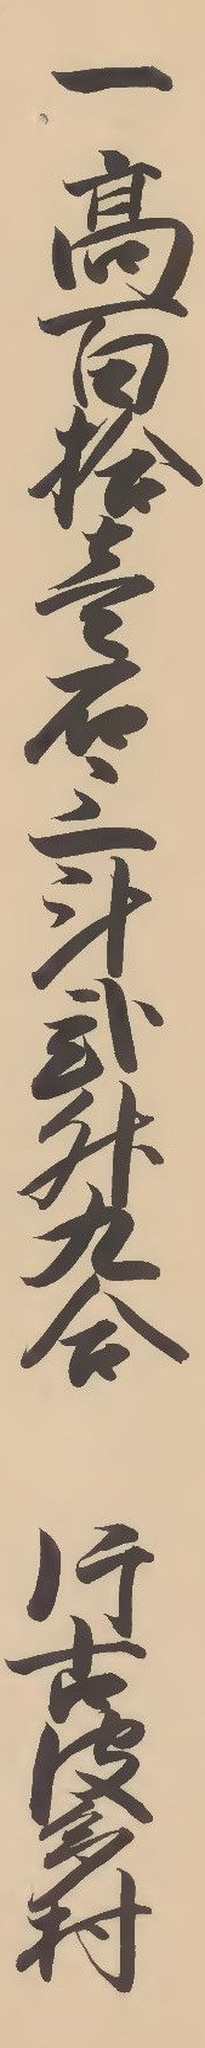一高百拾壱石三斗弐升九合片古皮多村
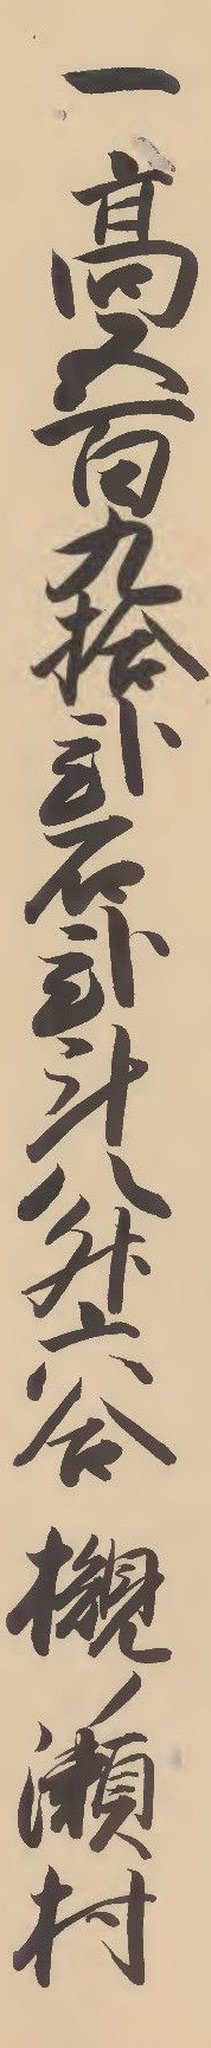一高五百九拾弐石弐斗八升六合槻ノ瀬村
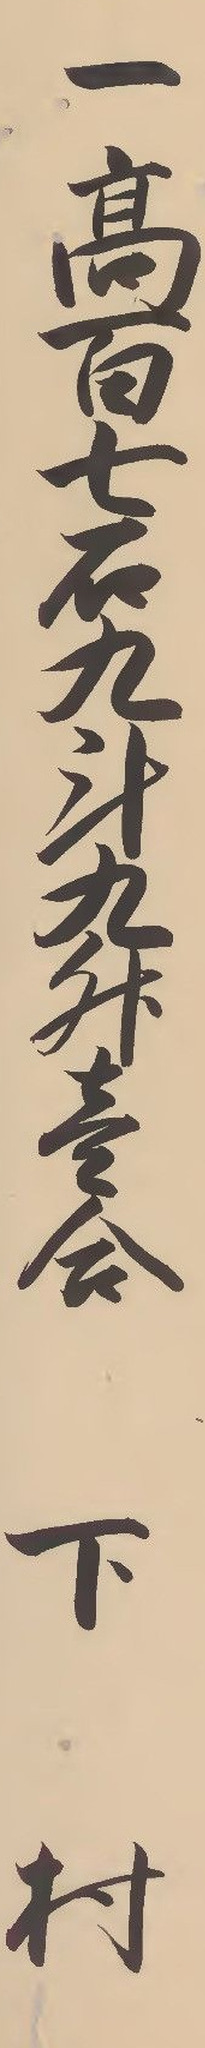一高百七石九斗九升壱合下村
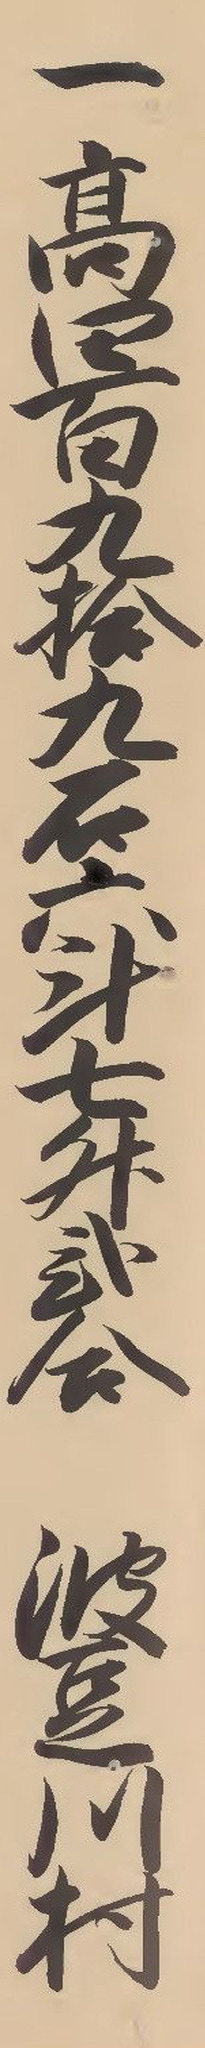一高四百九拾九石六斗七升弐合波豆川村
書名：摂津国郷帳
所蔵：国立公文書館 National Archives of Japan
